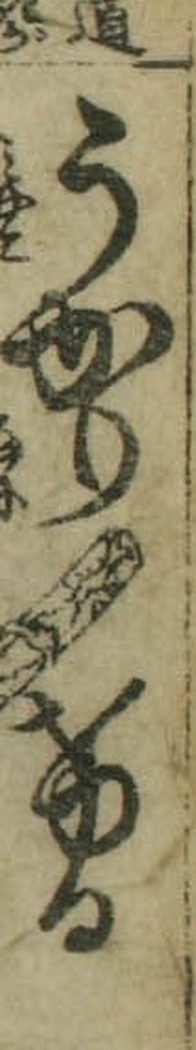うかりける
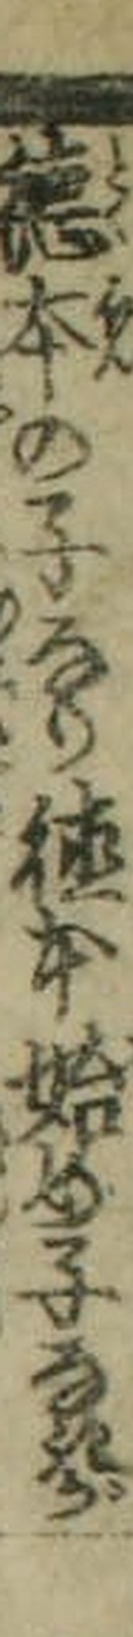徳本の子なり徳本始め子なきが
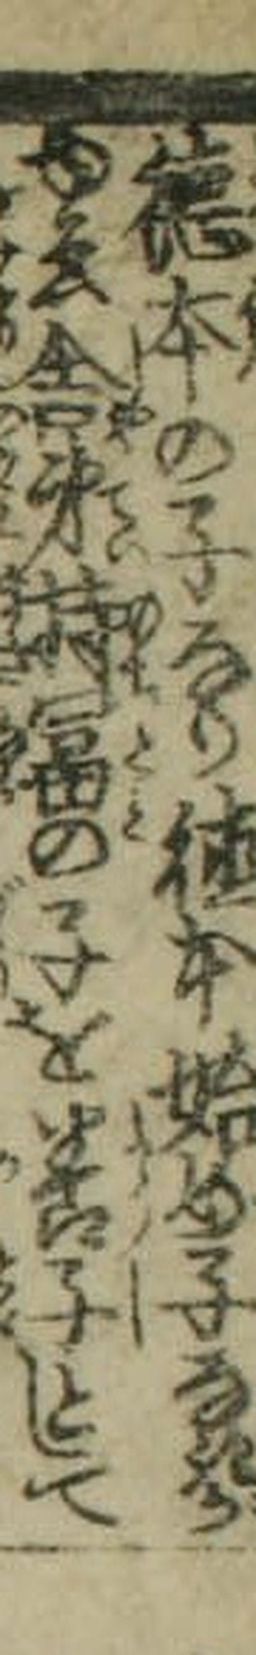ゆゑ舎弟持富の子を養子として
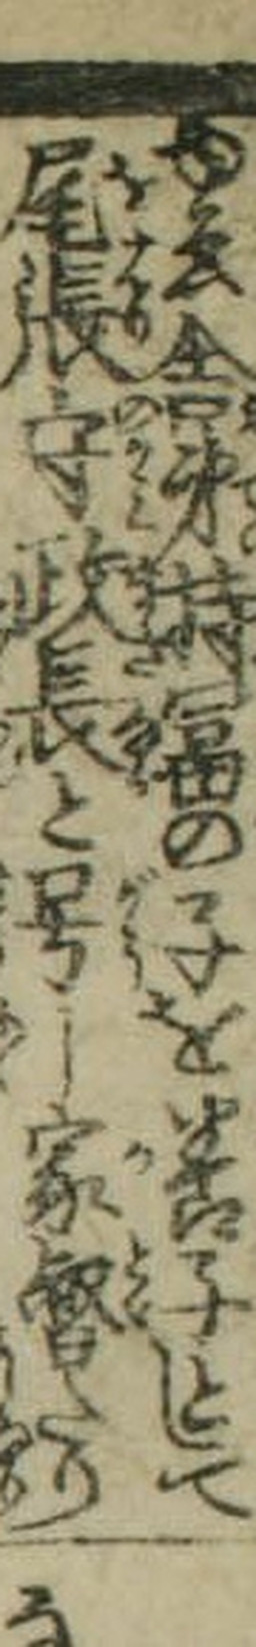尾張守政長と号し家督たり
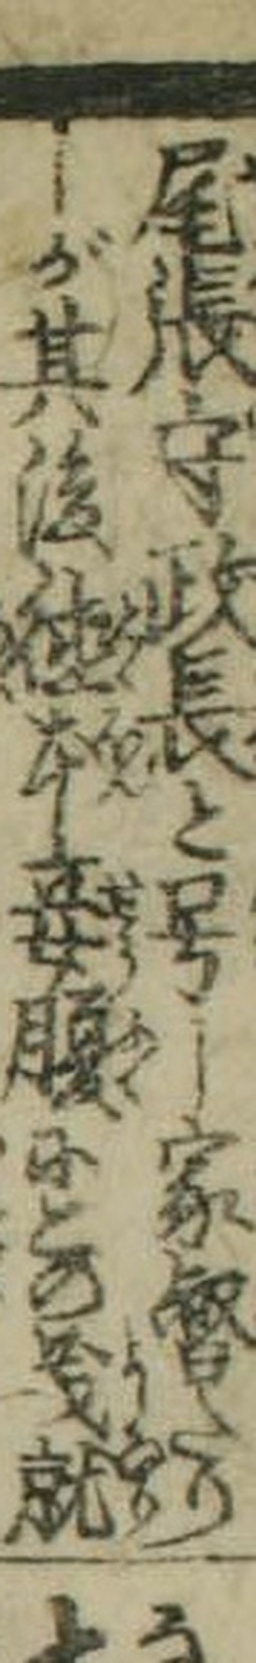しが其後徳本妾腹にこの義就
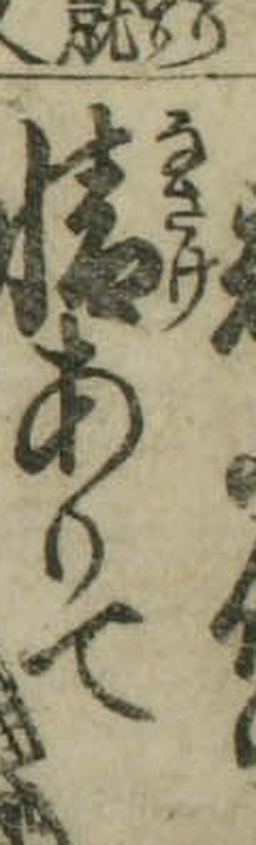情ありて
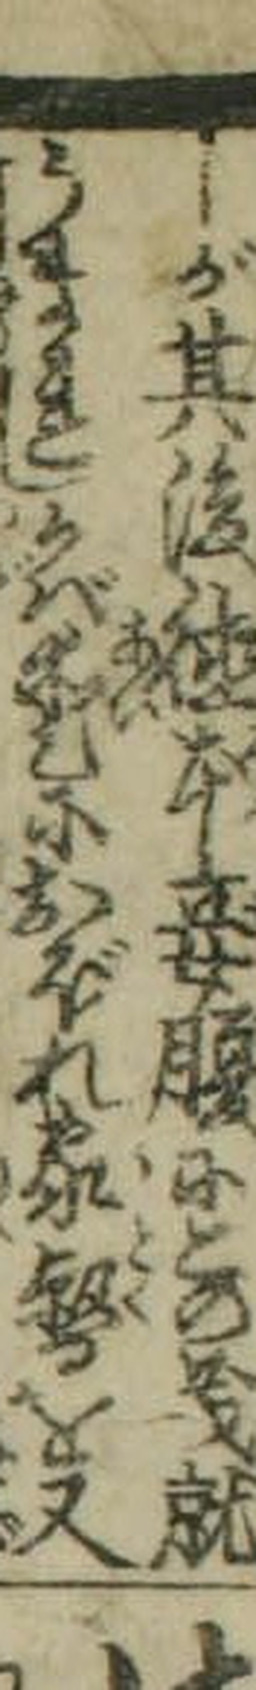うまれしかば愛におぼれ家督を又
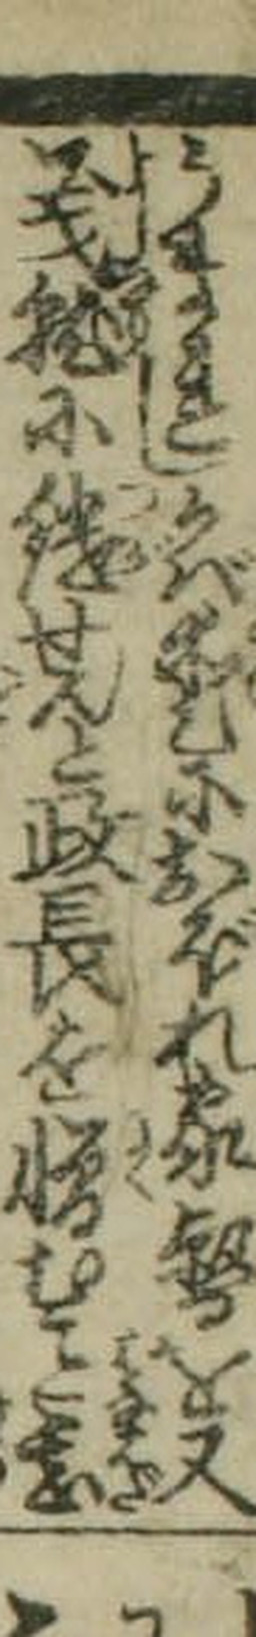義就に継せんと政長を憎むこと甚
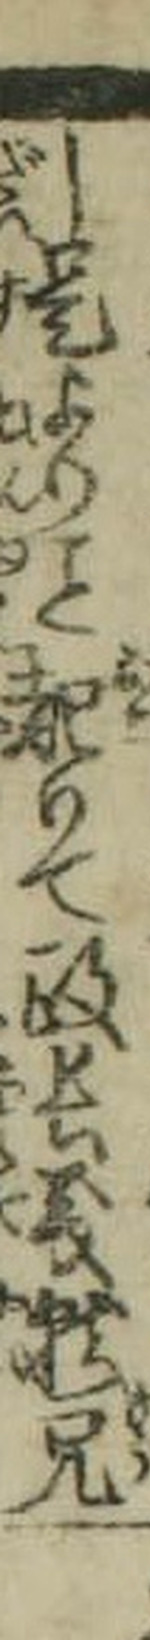し是よりこと起りて政長義就兄
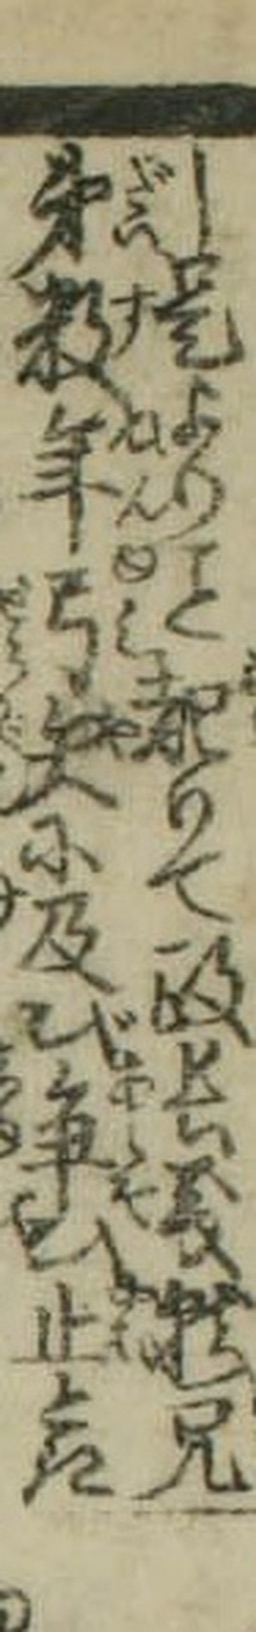弟数年弓矢に及び争ひ止とき
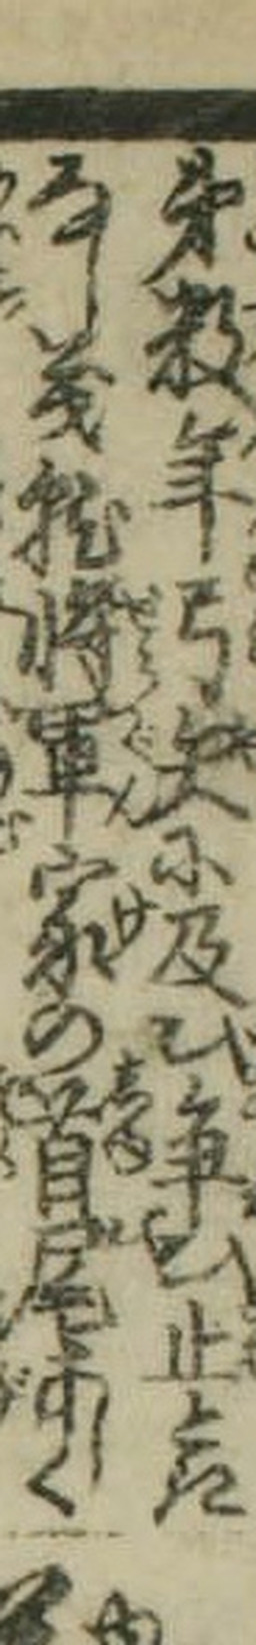なし義就将軍家の首尾あしく
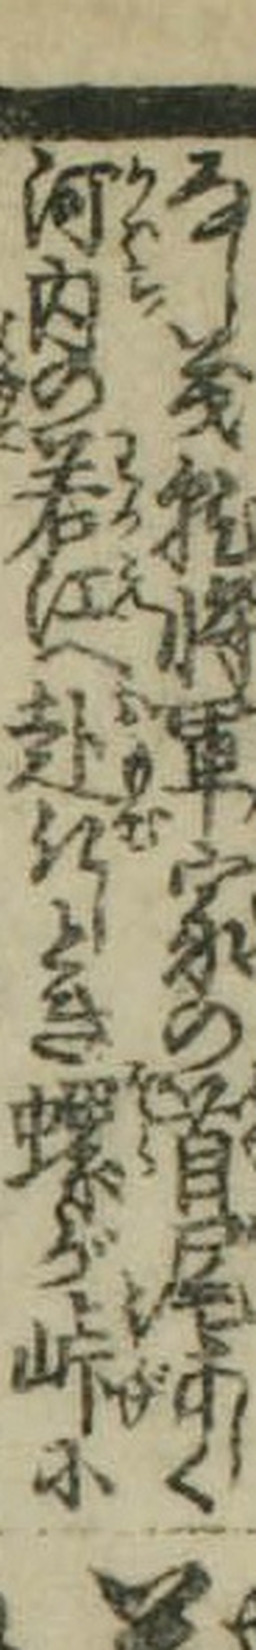河内の若江へ赴きしとき螺が峠に
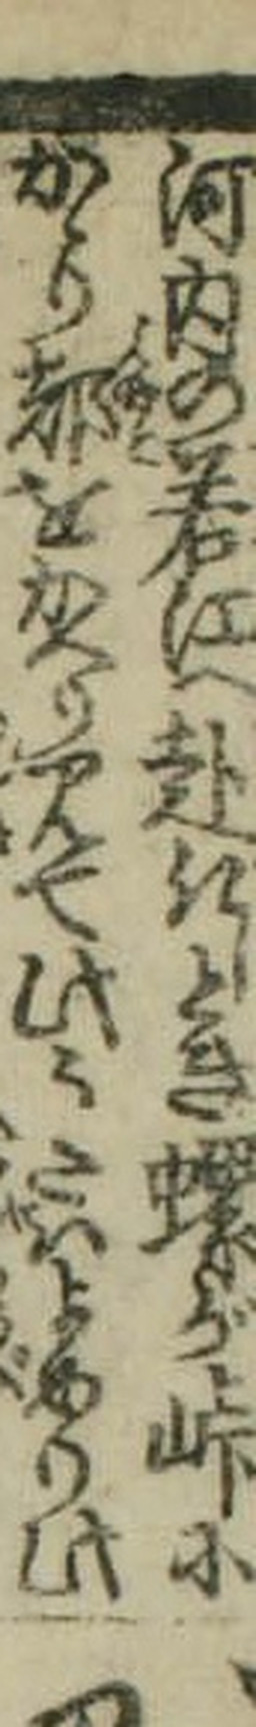かゝり都をかへり見て此うたはよめり此
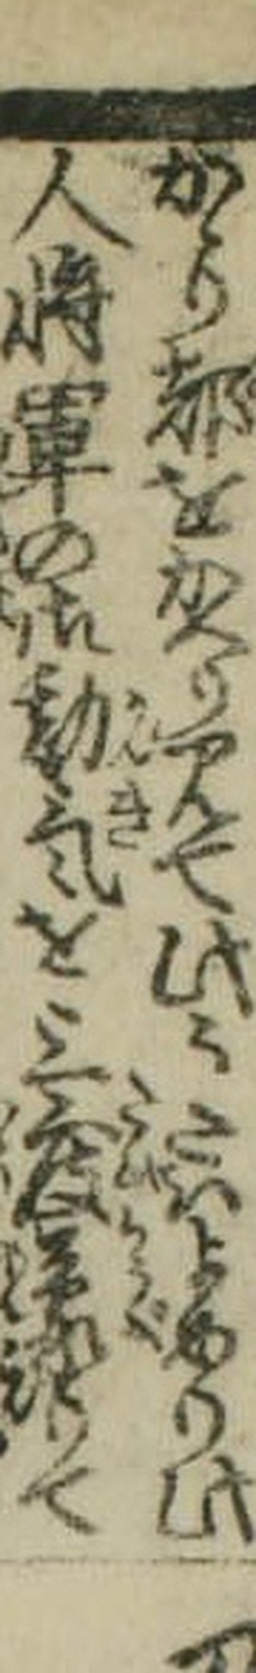人将軍の御勘気を三度蒙りて
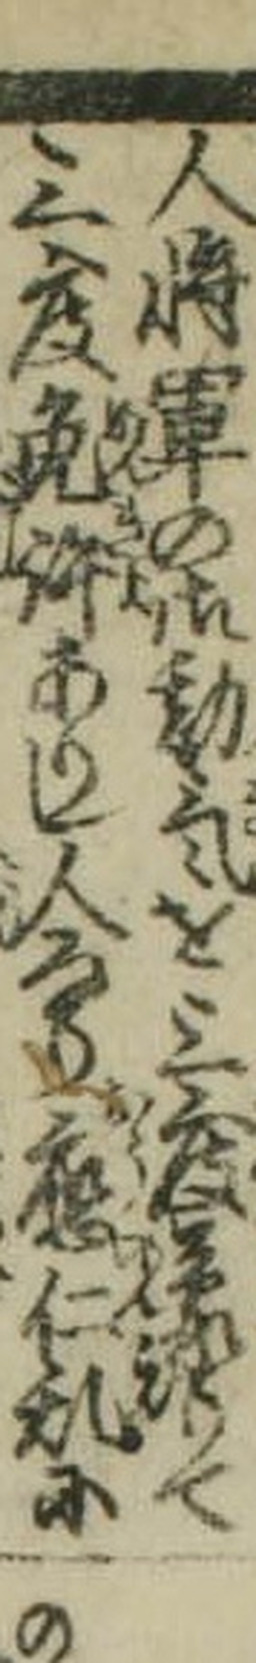三度免許ありし人なり応仁乱に
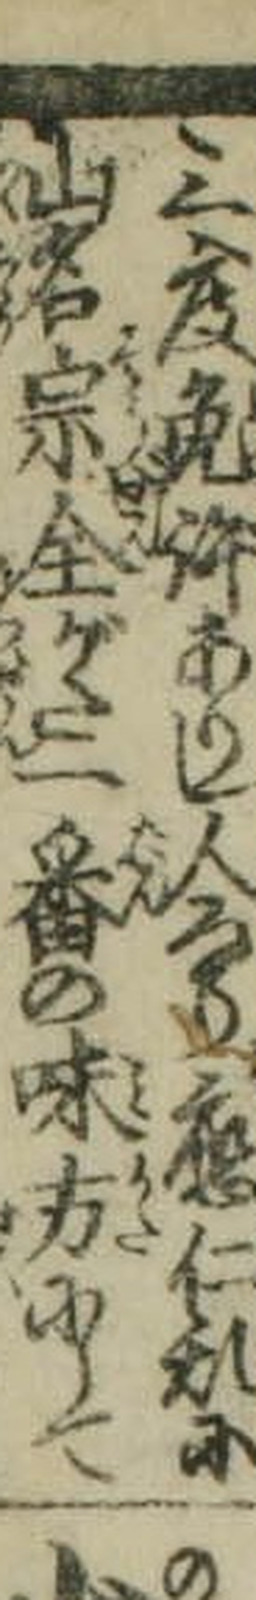山名宗全がた一番の味方にして
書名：續英雄百人一首
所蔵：東京学芸大学附属図書館
